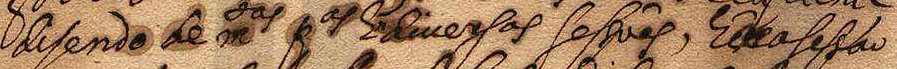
disendo de mtas pas En diuersas sessoẽs, E ē a sessão
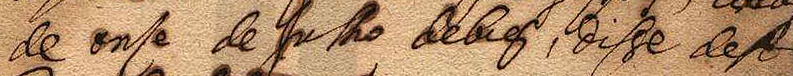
de onze de julho de 618, disse deste
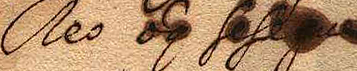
Reo o q̄ se segue
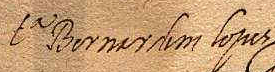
ta Bernardim lopes
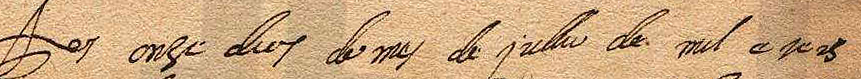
Aos onze dias do mes de julho de mil e seis
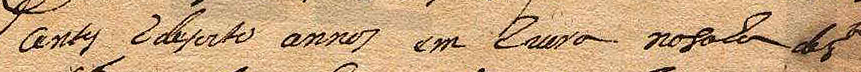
centos e desoito annos em Euora na sala da sta
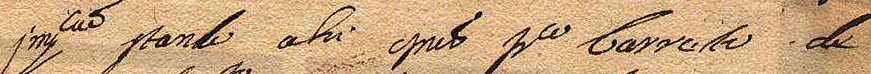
jmqçaõ stando ahi o snor̄ frco barreto de
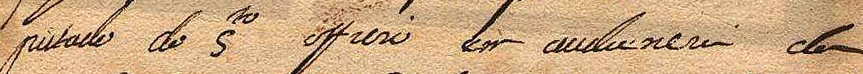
putado do sto officio em audiencia da
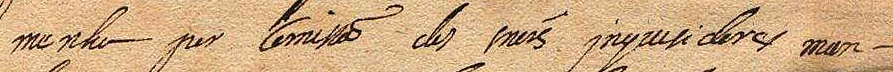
menha por Comissão dos snors̄ jnquisidores man
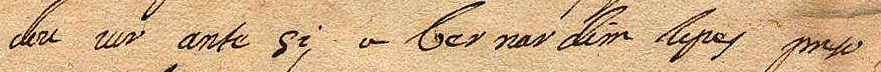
dou uir ante si, a bernardim lopes preso
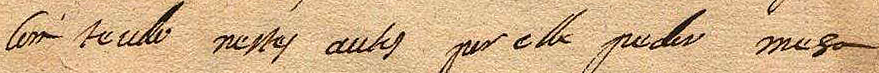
Comteudo nestes autos por elle pedir mesa
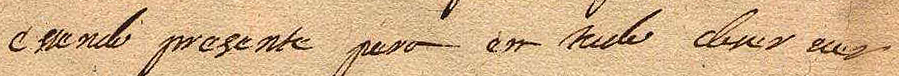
e ssendo presente pera em tudo diser uer
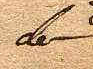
da
